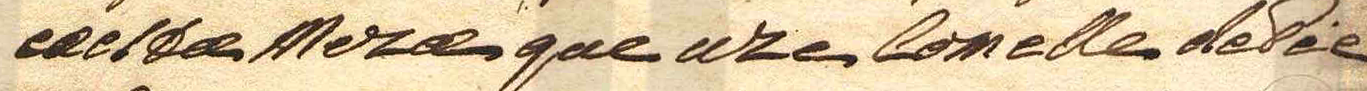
e a esta Meza que uze Com elle de Pie
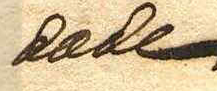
dade
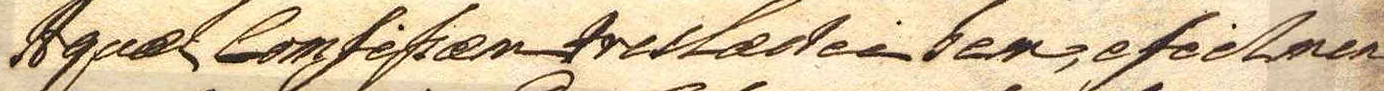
A qual Comfissam tresladei bem, e fielmen
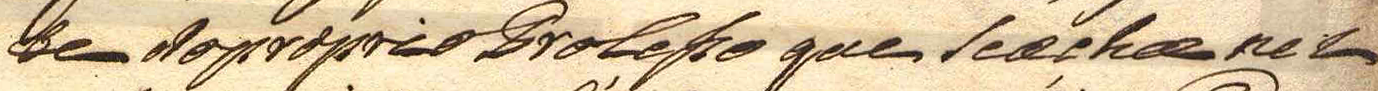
te do proprio ProÇesso que se açha nes
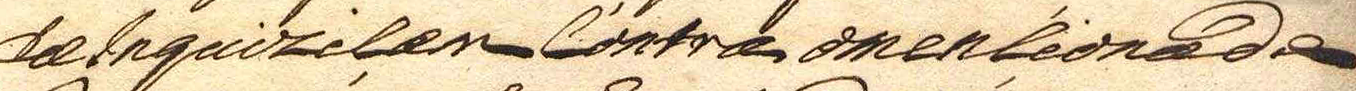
ta InquiziÇam Contra o menÇionado
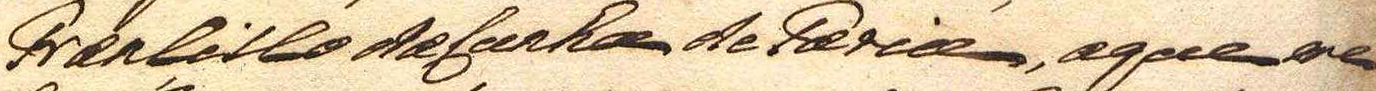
FranÇisCo da Cunha de Faria, a que me
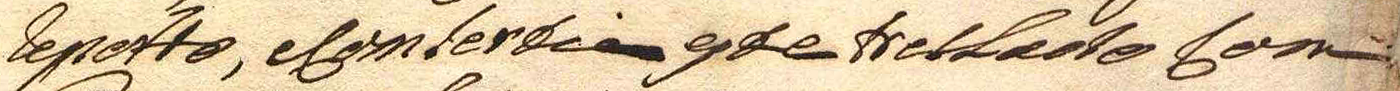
Reporto, e Comsertie este treslado Com
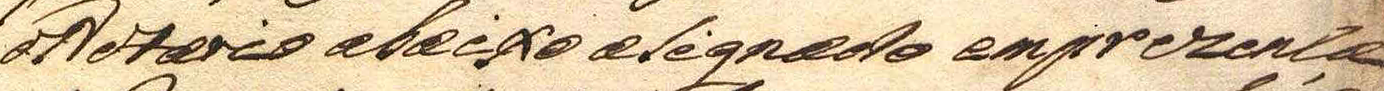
o Notario abaixo asignado em prezença
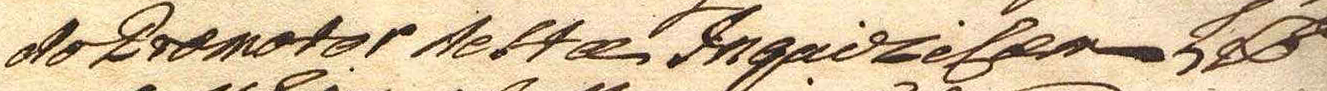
do Promotor desta InquiziCam Lx.a
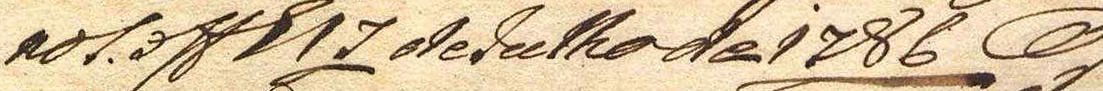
no s. off.o i7 de Iulho de i786 ā
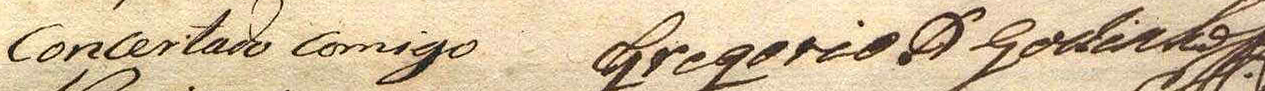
concertado comigo Gregorio X Godinho
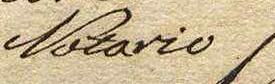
Notario
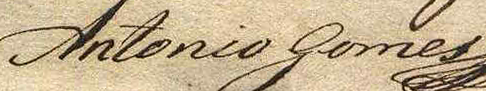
Antonio Gomes
